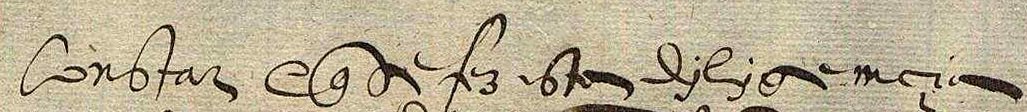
Constar e q̄ se fez esta dylygemcia
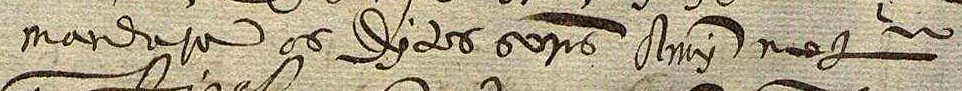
mandarā os dytos sōres A mȳ notro
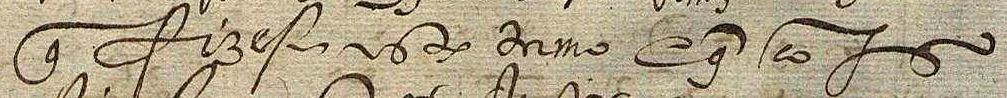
q̄ fizese este termo e q̄ c̄o Jso
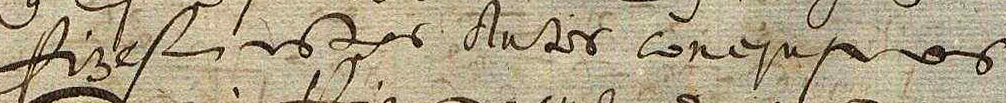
fizese estes Autos concrusos
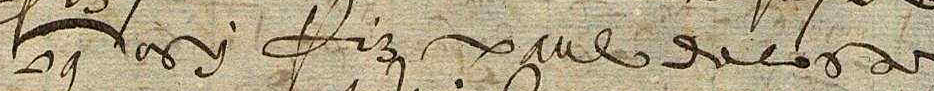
o q̄ asy fiz paulo da costa
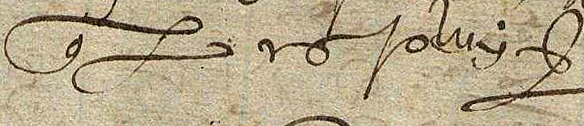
q̄ ho espruy
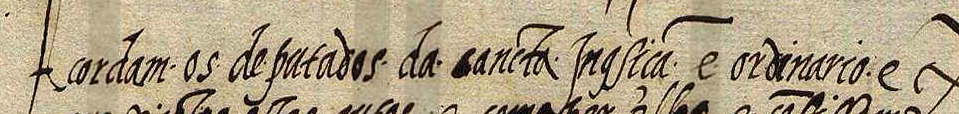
Acordam os deputados da sancta Jnqisiçā e ordinario e c̄ꝭ
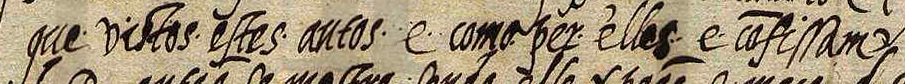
que vistos estes autos e como per elles e cōfissam
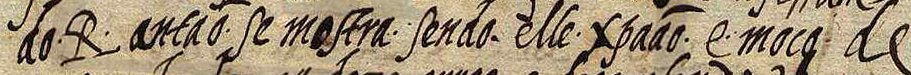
do R antaõ se mostra sendo elle xpaão e moço de
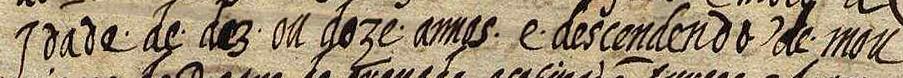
Jdade de dez ou doze annos. e descendendo de mou
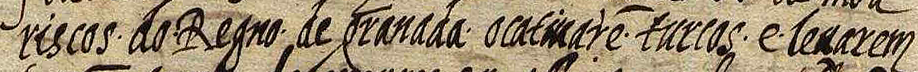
riscos do Regno de granada o catiuarē turcos e leuarem
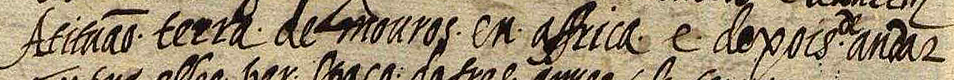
A tituão terra de mouros en affrica e depois de andar
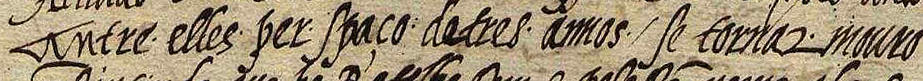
Antre elles per spaço de tres annos / se tornar mouro
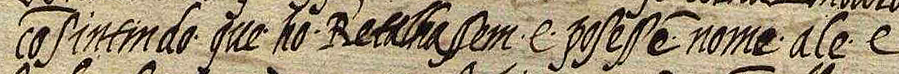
cōsintindo que ho Retalhassem e posessē nome ale e
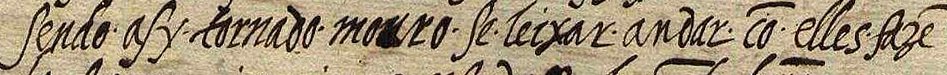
sendo asy tornado mouro se leixar andar c̄o elles fazē
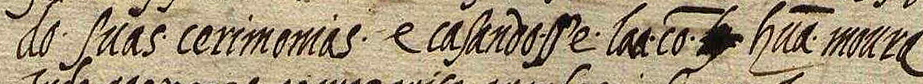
do suas cerimonias e casando-sse laa cō hūa moura
